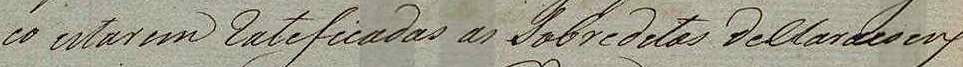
co estarem Rateficadas as Sobredetas deClaracoens
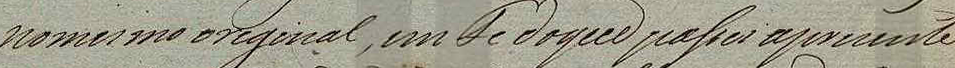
no mesmo oreginal, em Fe do que passei a prezente
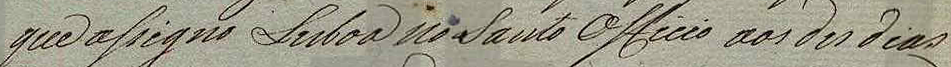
que assigno Lesboa no Santo Officio aos des dias
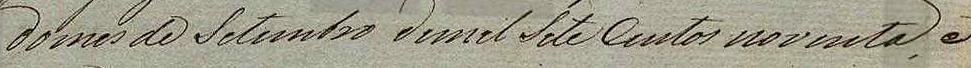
do mes de Setembro de mil SeteCentos noventa e
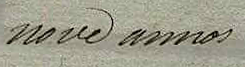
nove annos
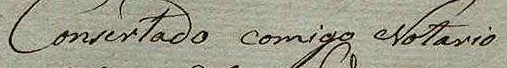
Consertado comigo Notario
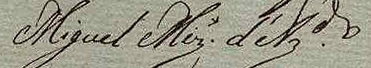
Miguel Miz̄ d'Az.do
